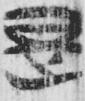是
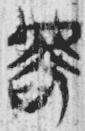唬（乎）
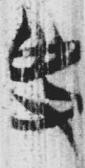拃（作）
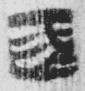爲
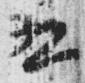九
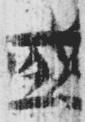城（成）
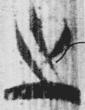之
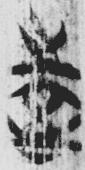臺
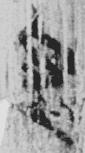視（寘）
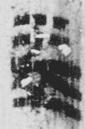盂
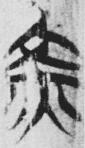炭
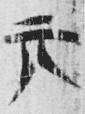亓（其）
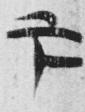下
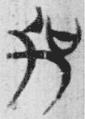加
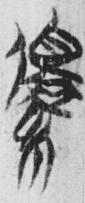○（圜）
